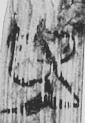安
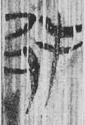邦
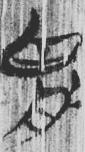{胃刀}（謂）
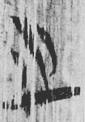之
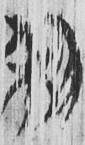利
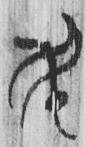民
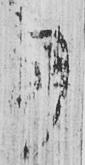含（今）
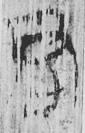君
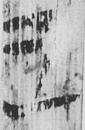王
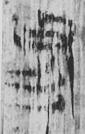○（盡）
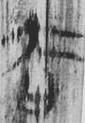去
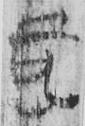耳
